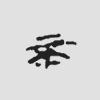不
